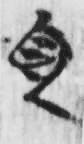見
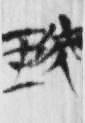琥
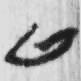㠯（以）
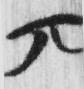亓（其）
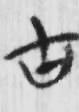古（故）
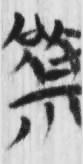敓
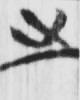之
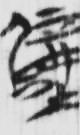壁
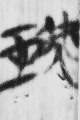琥
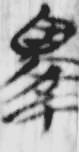睪（擇）
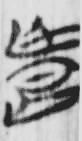良
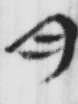月
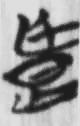良
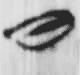日
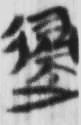歸
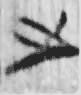之
